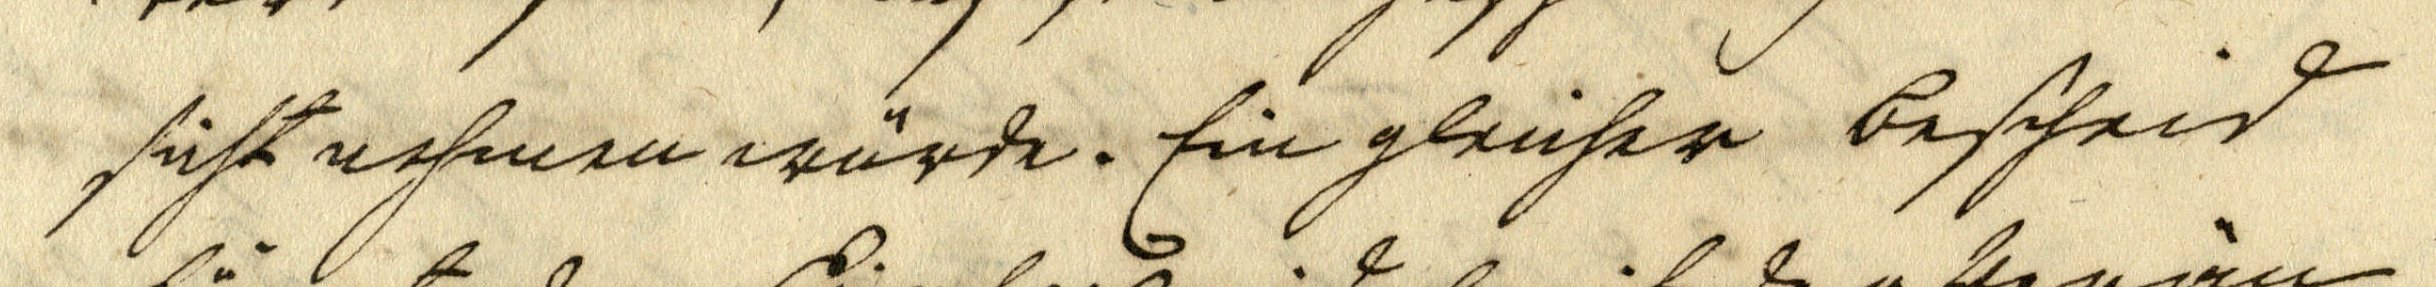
sicht nehmen würde. Ein gleicher Bescheid
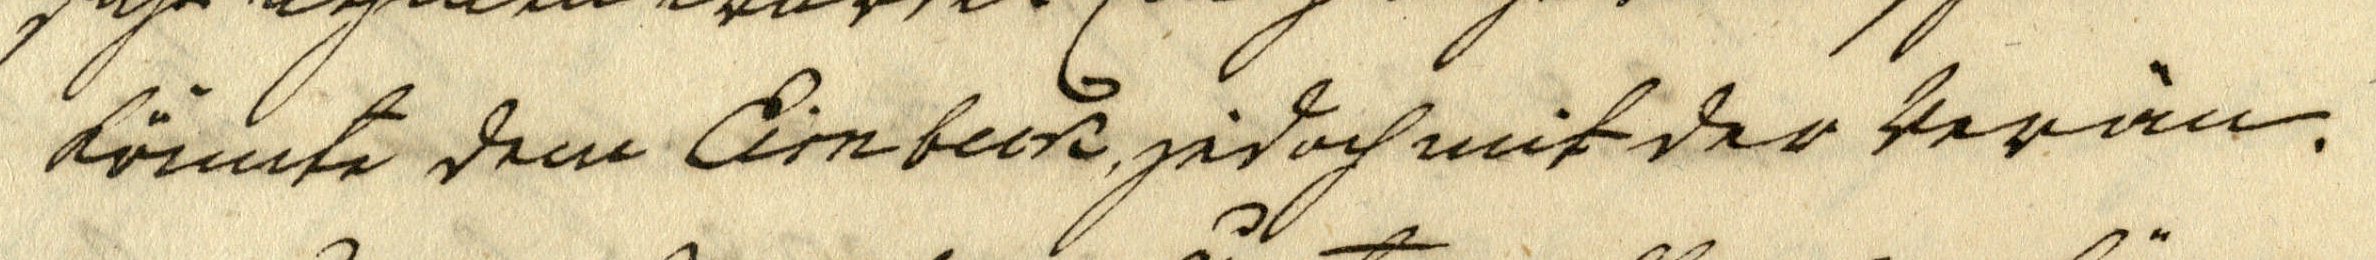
könnte dem Eimbeck, jedoch mit der Verän-
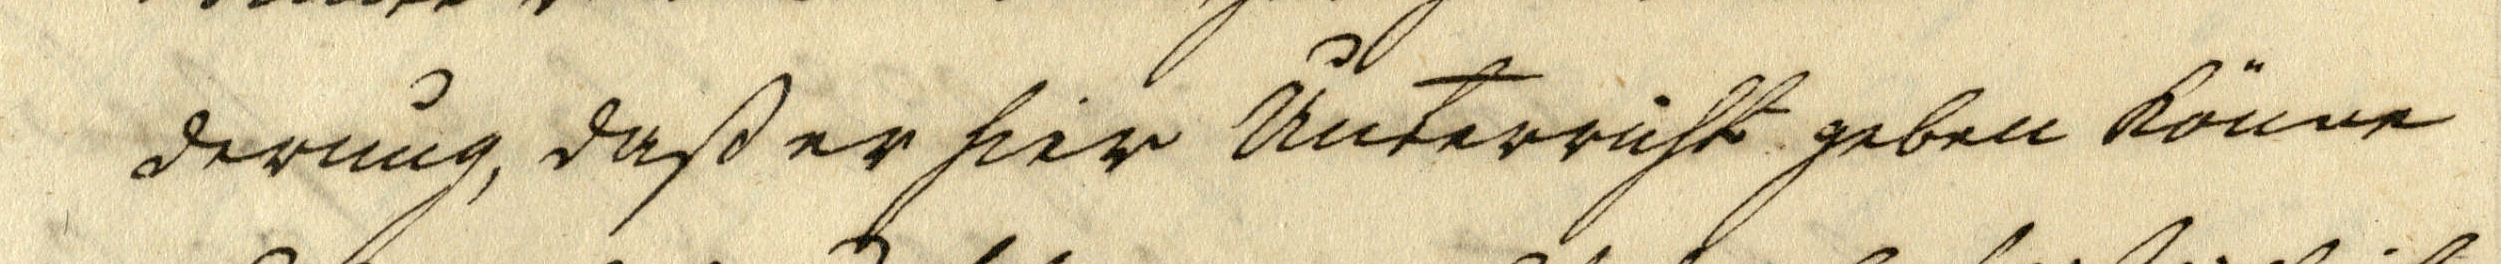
derung, daß er hier Unterricht geben könne
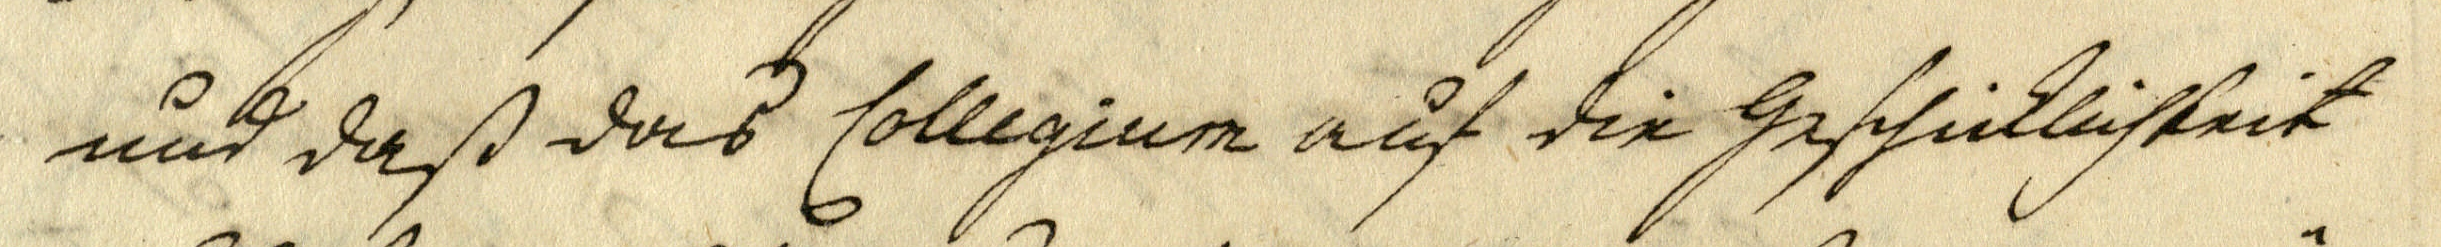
und daß das Collegium auf die Geschicklichkeit
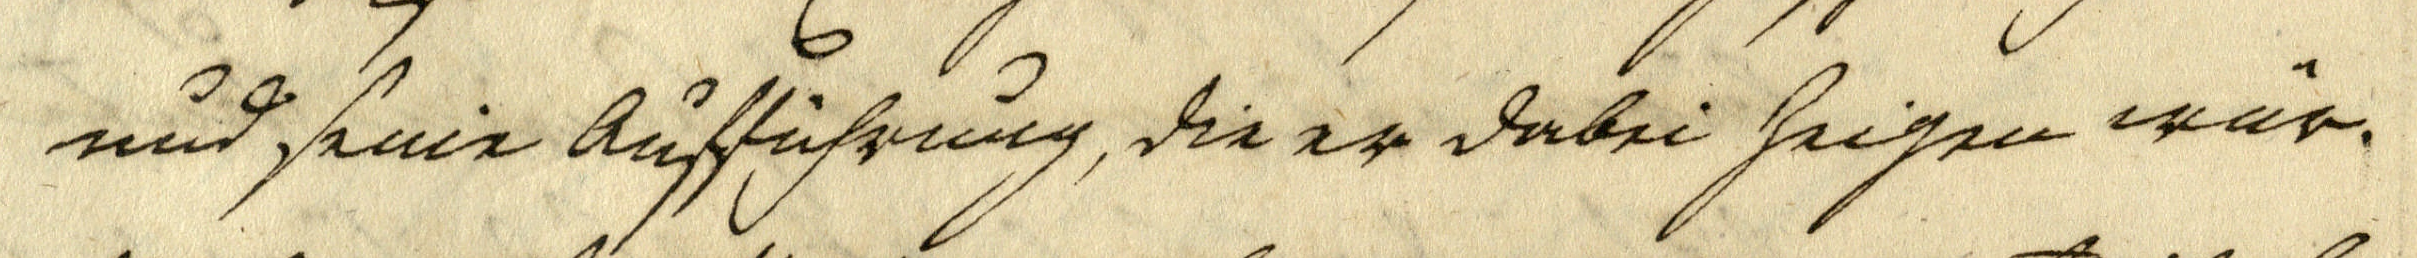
und seine Aufführung, die er dabei zeigen wür-
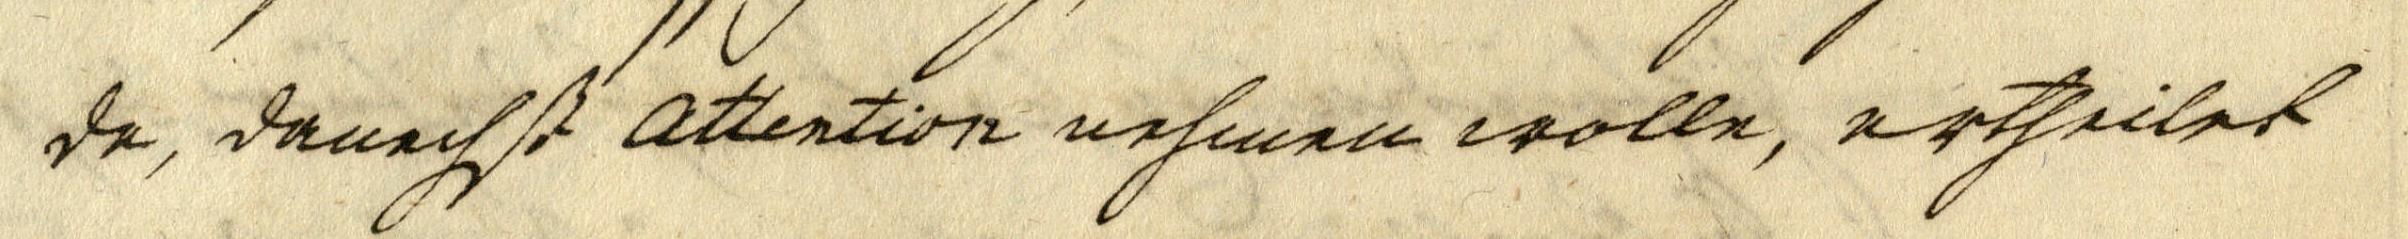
de, danechst Attention nehmen wolle, ertheilet
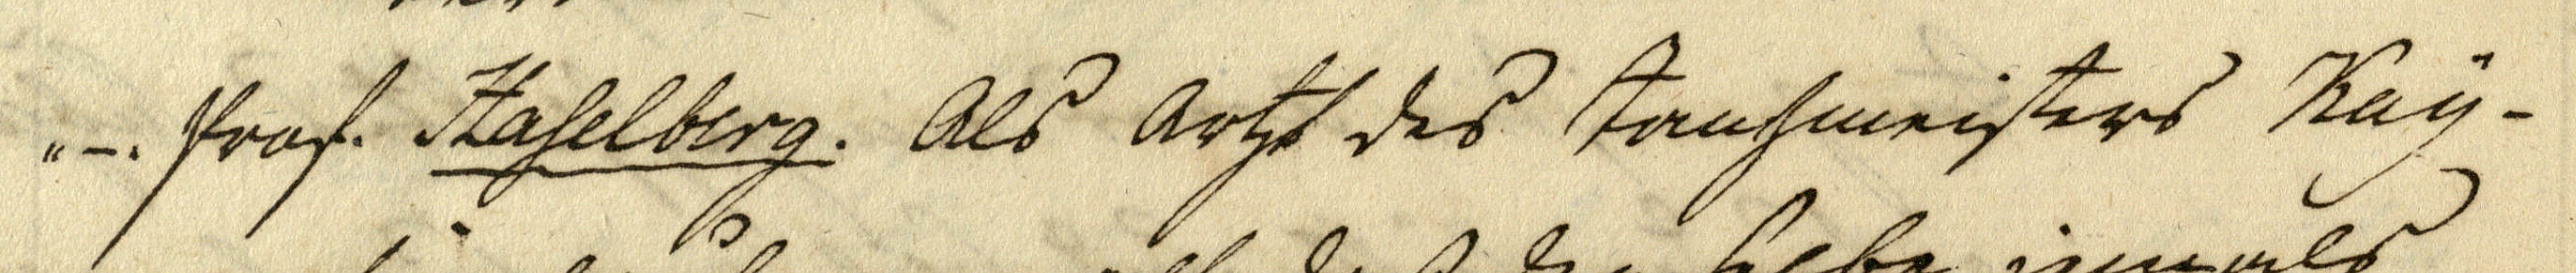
" - " Prof. Haselberg. Als Arzt des Tanzmeisters Kay-
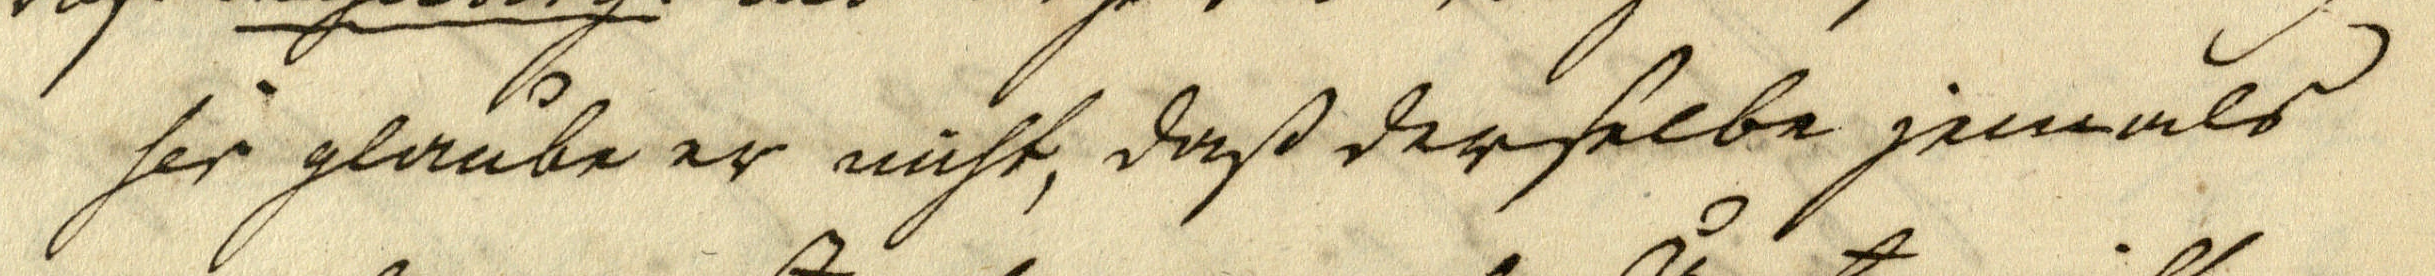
ser glaube er nicht, daß derselbe jemals
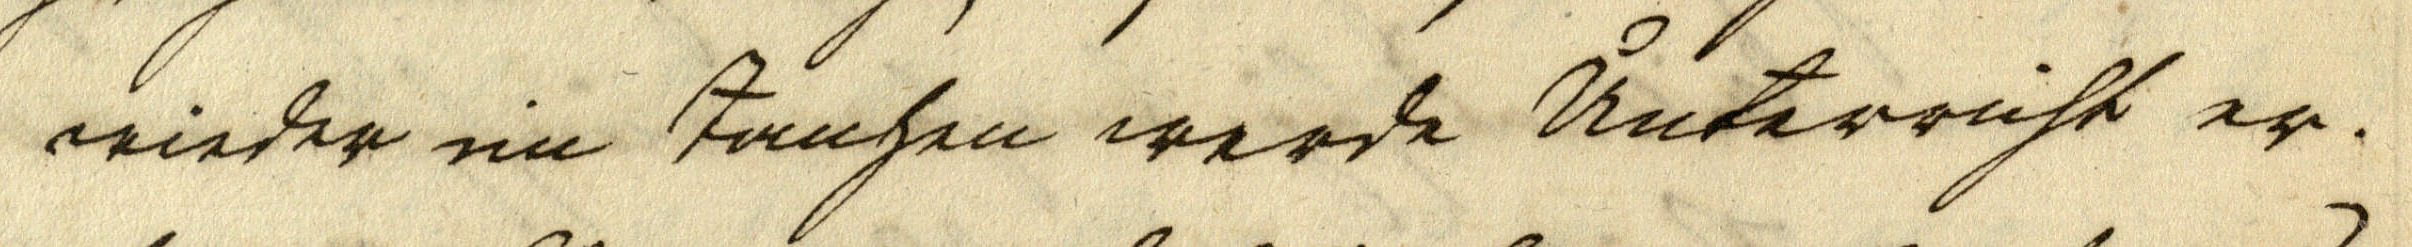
wieder im Tanzen werde Unterricht er-
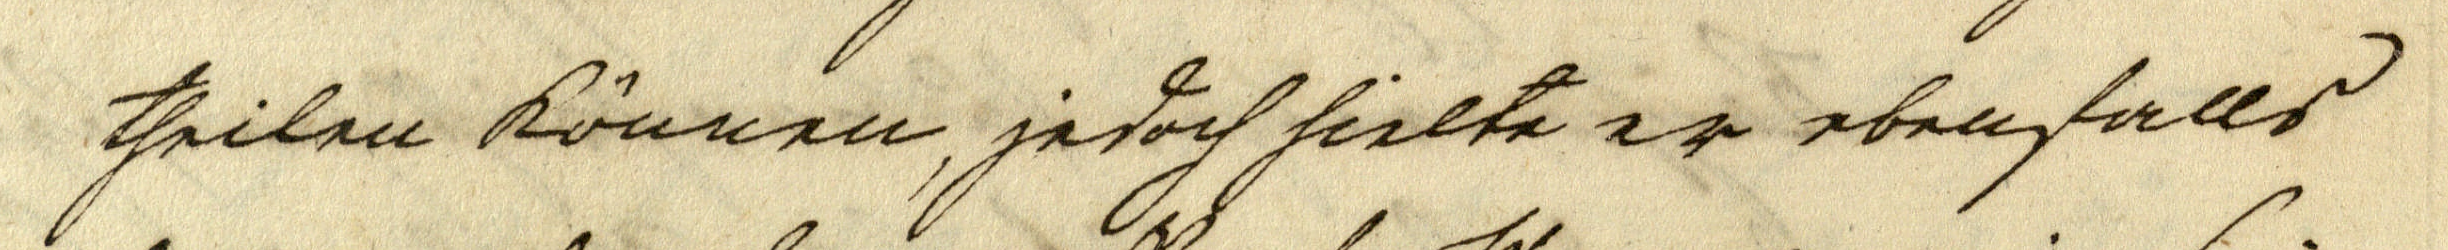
theilen können, jedoch hielte er ebenfalls
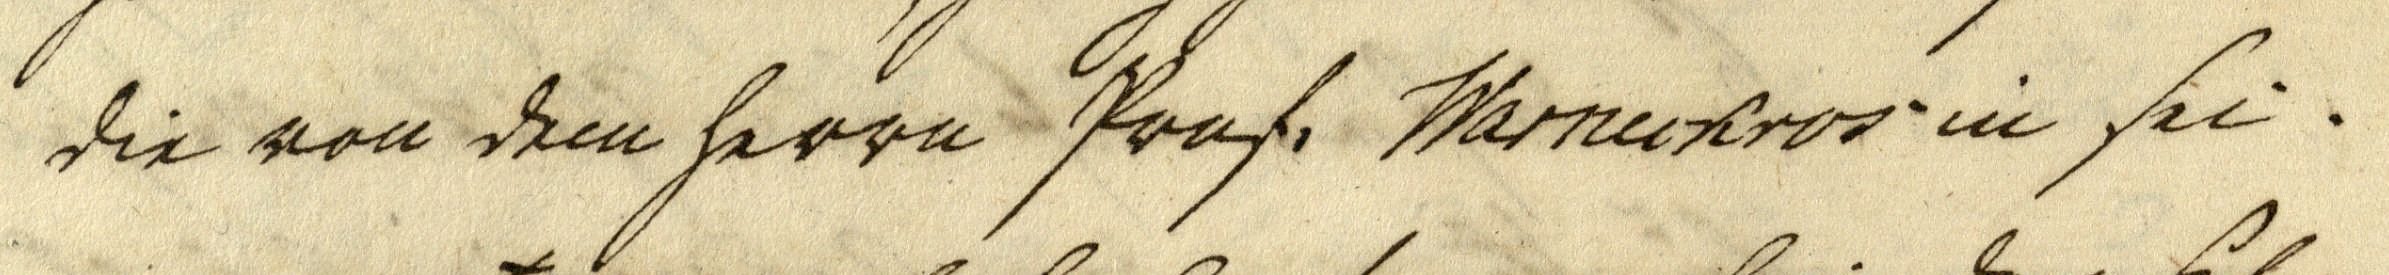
die von dem Herrn Prof. Warneckros in sei-
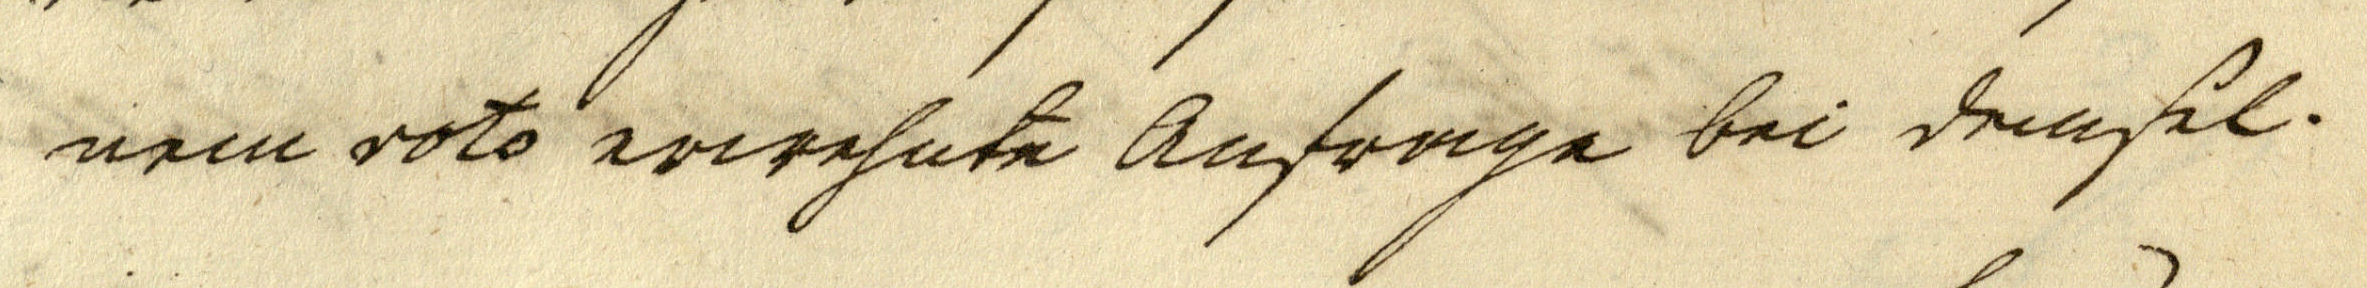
nem voto erwehnte Anfrage bei demsel-
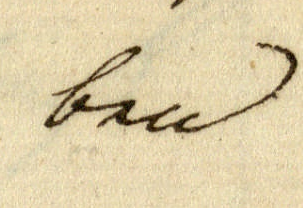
ben
